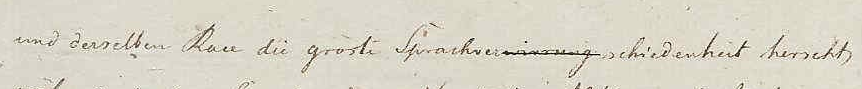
und derselben Race die gröste Sprachverwirrungschiedenheit herscht,
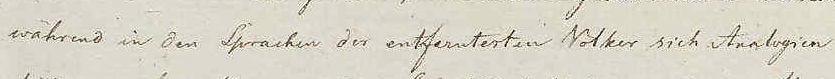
während in den Sprachen der entferntesten Völker sich Analogien
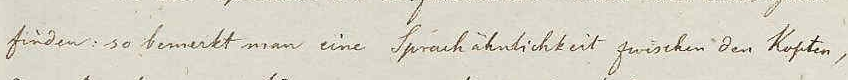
finden: so bemerkt man eine Sprachähnlichkeit zwischen den Kopten,
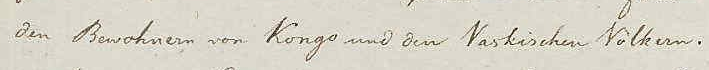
den Bewohnern von Kongo und den Vaskischen Völkern.
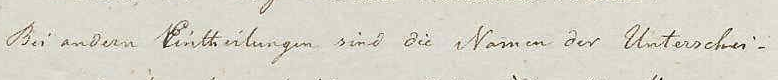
Bei andern VEintheilungen sind die Namen der Unterschei-
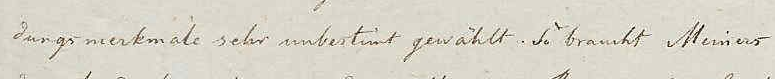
dungsmerkmale sehr unbestimt gewählt. So braucht Meiners
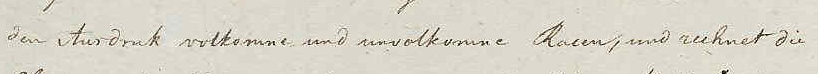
den Ausdruk volkomne und unvolkomne Racen, und rechnet die
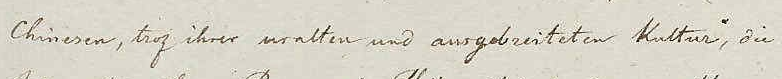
Chinesen, troz ihrer uralten und ausgebreiteten Kultur, die
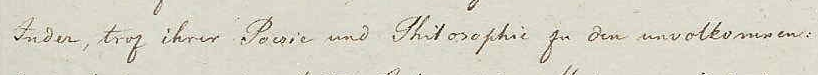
Inder, troz ihrer Poesie und Philosophie zu den unvolkomnen:
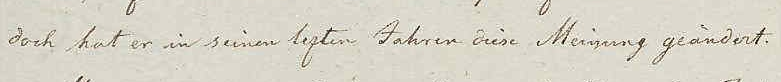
doch hat er in seinen lezten Jahren diese Meinung geändert.
